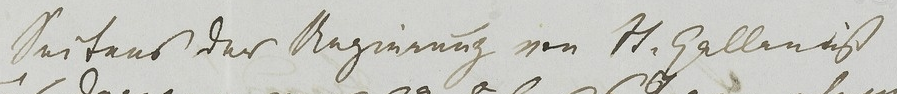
Seitens der Regierung von St. Gallen ist
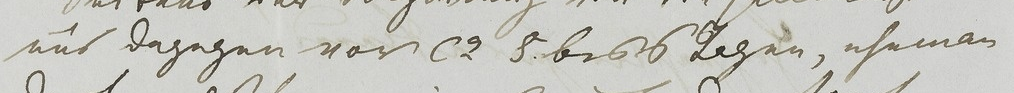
uns dagegen vor ca 5 bis 6 Tagen, ehe man
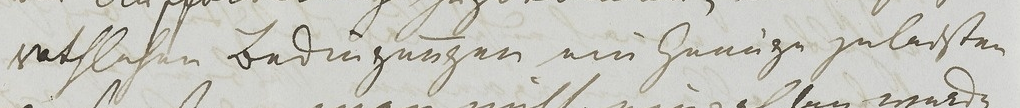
räthlichen Bedingungen ein Genüge zu leisten
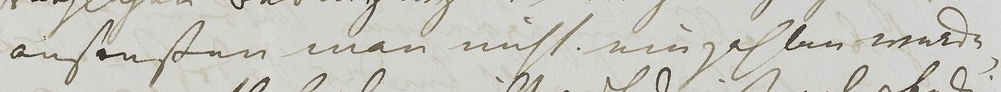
ansonsten man nicht einzahlen werde,
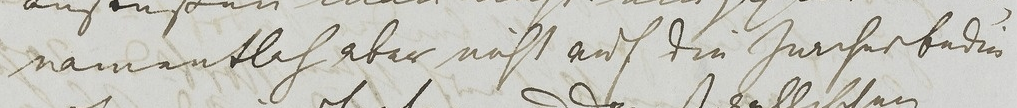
namentlich aber nicht auf die Zürcher Bedin
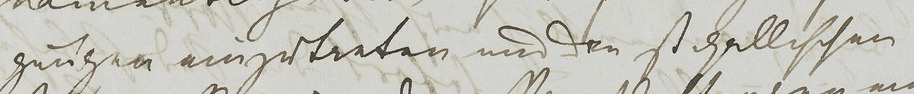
gungen einzutreten und den st. gallischen
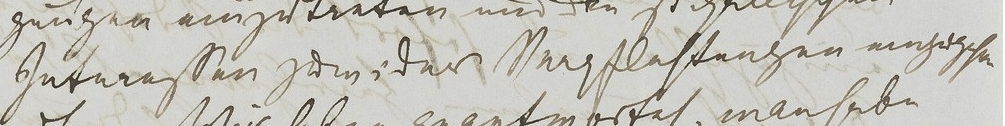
Interessen zuwider Verpflichtungen einzugehen
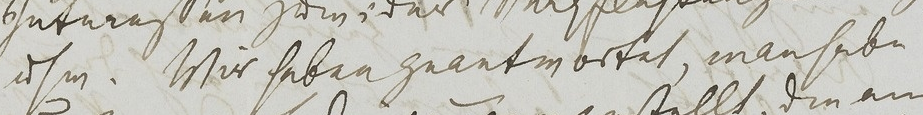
usw. Wir haben geantwortet, man habe
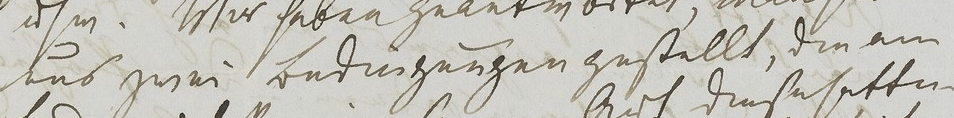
uns zwei Bedingungen gestellt, die am
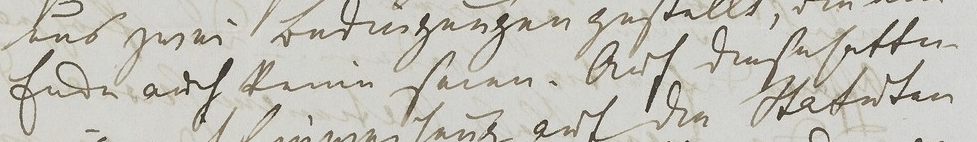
Ende auch keine seien. Auf diese hatten
